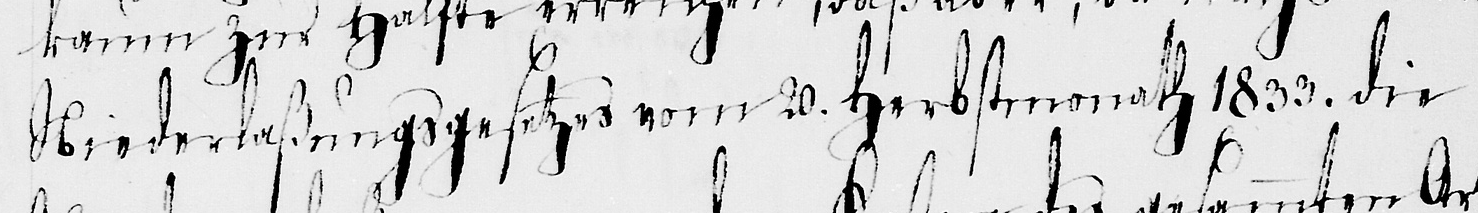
Niederlaßungsgesetzes vom 20. Herbstmonath 1833. die
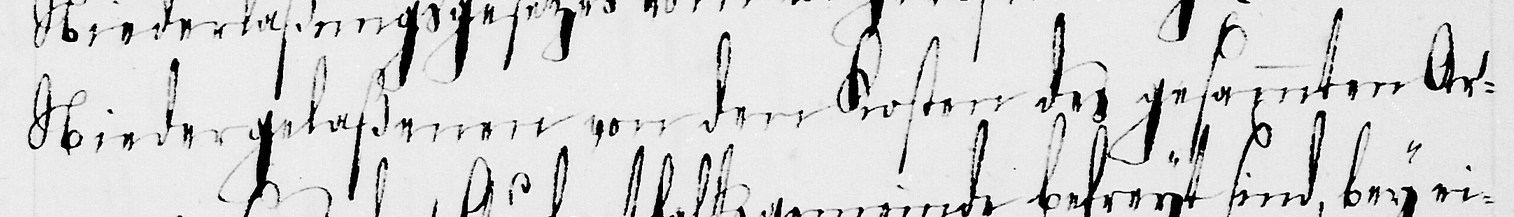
Niedergelaßenen von den Kosten des gesammten Ar¬
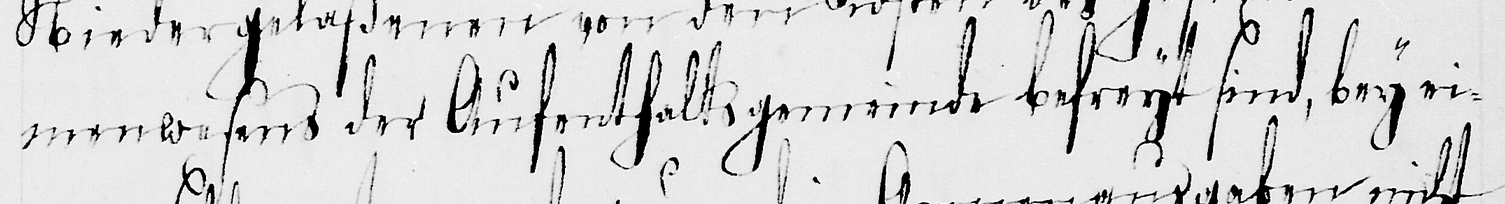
menwesens der Aufenthaltsgemeinde befreyt sind, bey ei¬
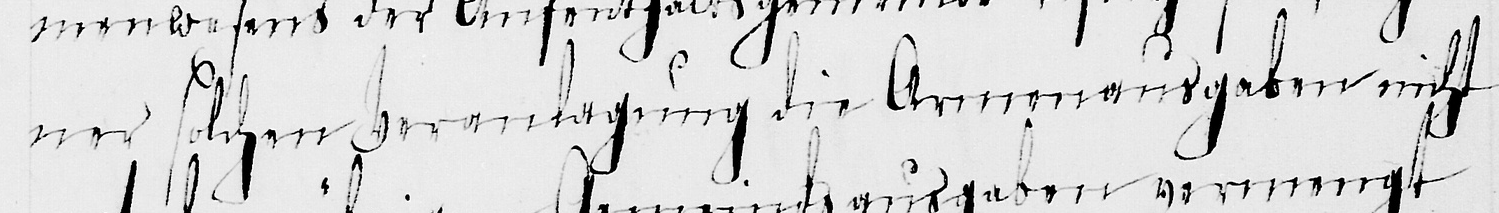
ner solchen Veranlagung die Armenausgaben nicht
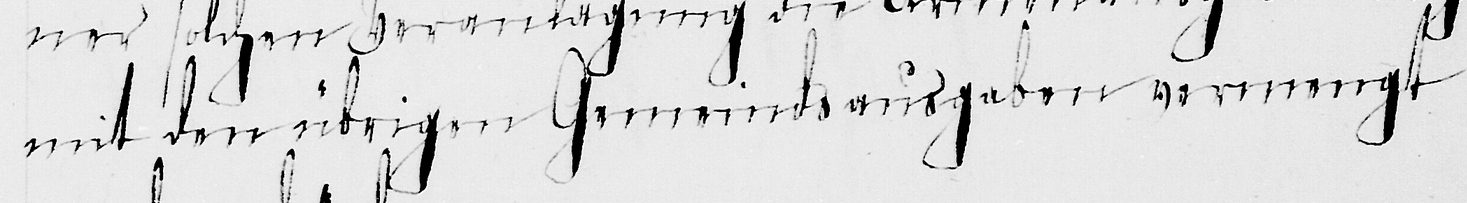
mit den übrigen Gemeindsausgaben vermengt
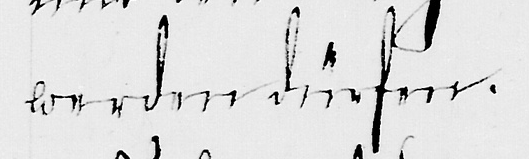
werden dürfen.
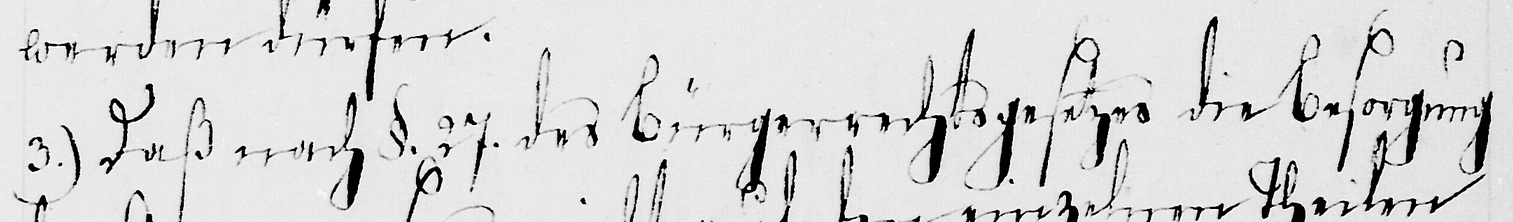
3.) Daß nach §. 27. des Bürgerrechtsgesetzes die Besorgung
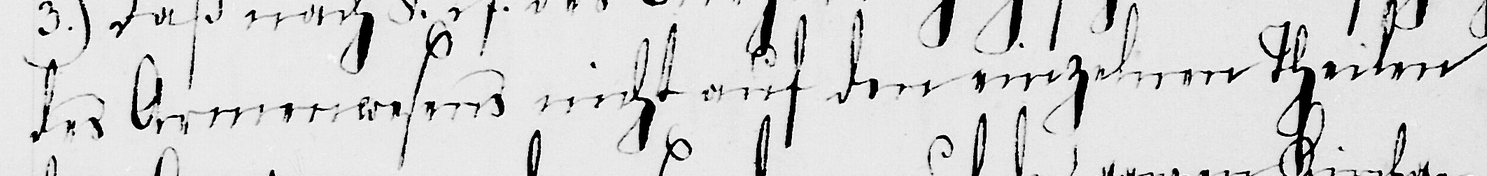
des Armenwesens nicht auf den einzelnen Theilen
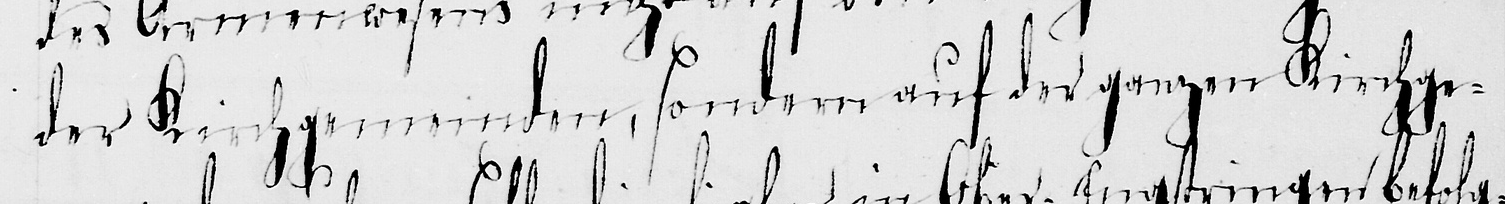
der Kirchgemeinden, sondern auf der ganzen Kirchge¬
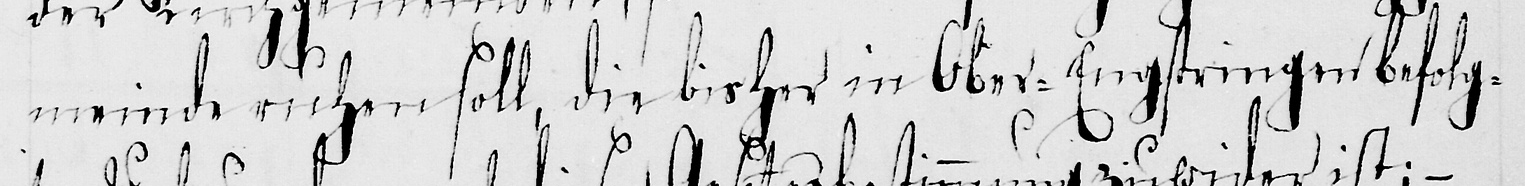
meinde ruhen soll, die bisher in Ober-Engstringen befolg¬
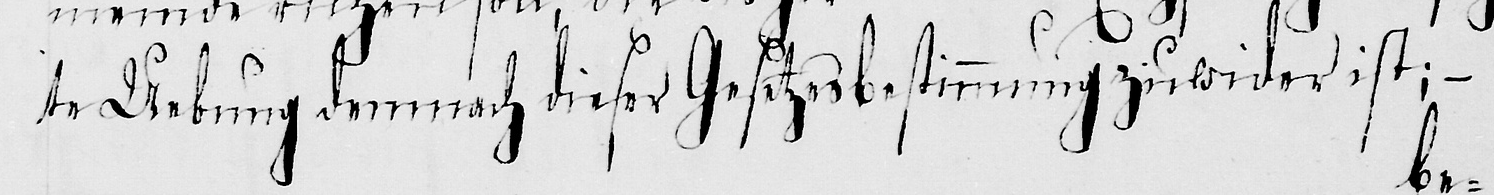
te Uebung demnach dieser Gesetzesbestimmung zuwider ist; –
